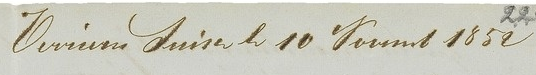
Verrieres Suisse le 10 Novemb 1852
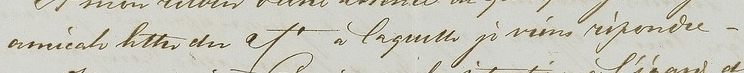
amicale lettre du 2 Ct à laquelle je viens répondre.
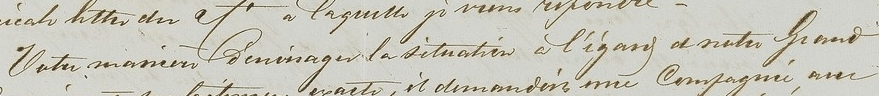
Votre manière d'envisager la situation à l'égard de notre Grand
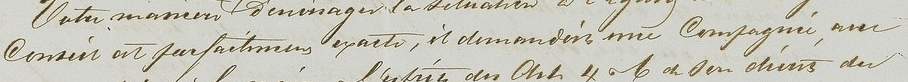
Conseil est parfaitement exacte, il demandait une Compagnie, avec
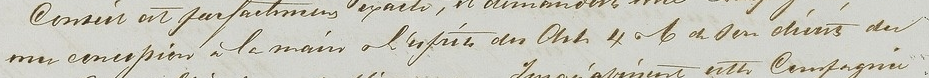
une concession à la main & l'esprit des Art. 4 & 6 de son décrét du
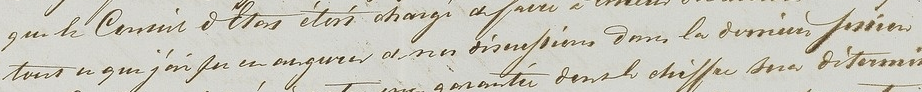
tout ce que j'ai pu en augurer de mes discussions dans la derniere session
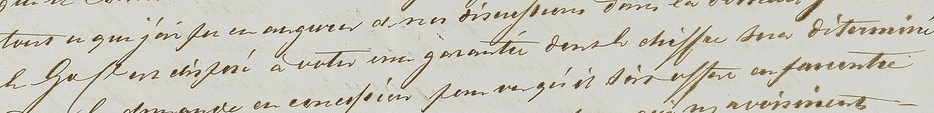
le Gr Cl est disposé a voter une garantie dont le chiffre sera déterminé
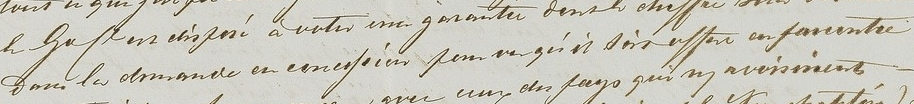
dans la demande en concession pour vu qu'il soit offert en parcontre
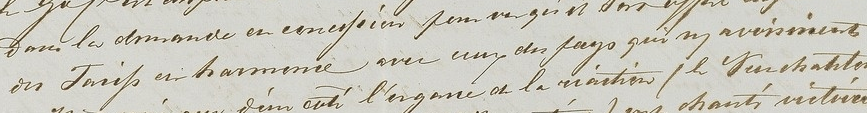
des Tarifs en harmonie avec ceux des pays qui nous avoisinent.
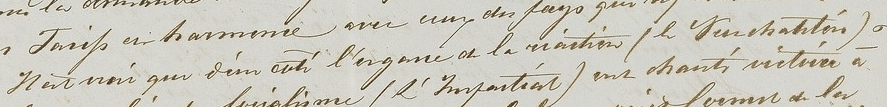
Il est vrai que d'un côté l'organe de la réaction (le Neuchatelois) &
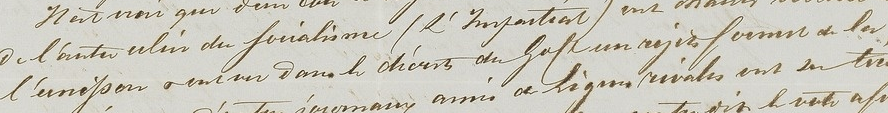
l'emisson & ont vu dans le decret du Gr Cl un rejet formel de la
